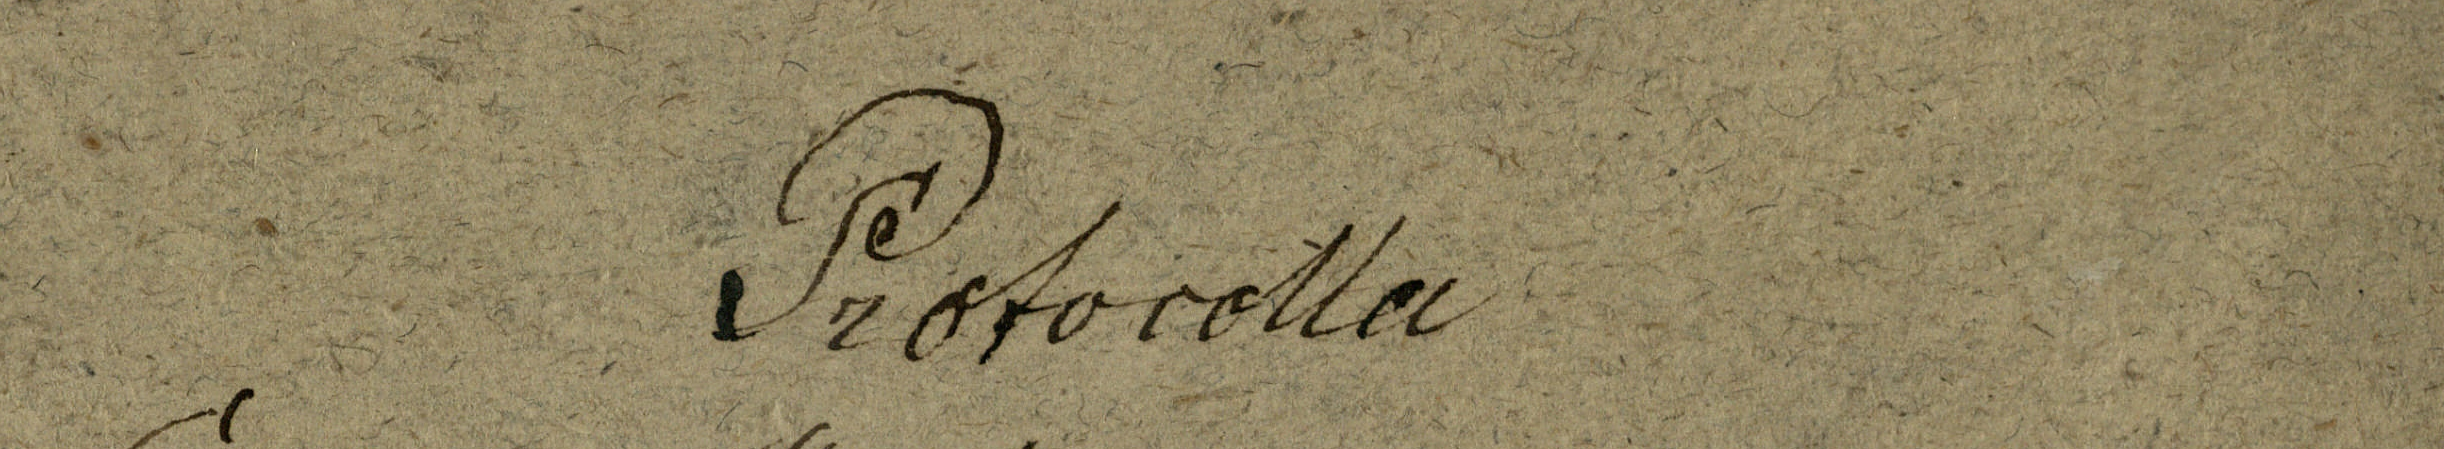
Protocolla
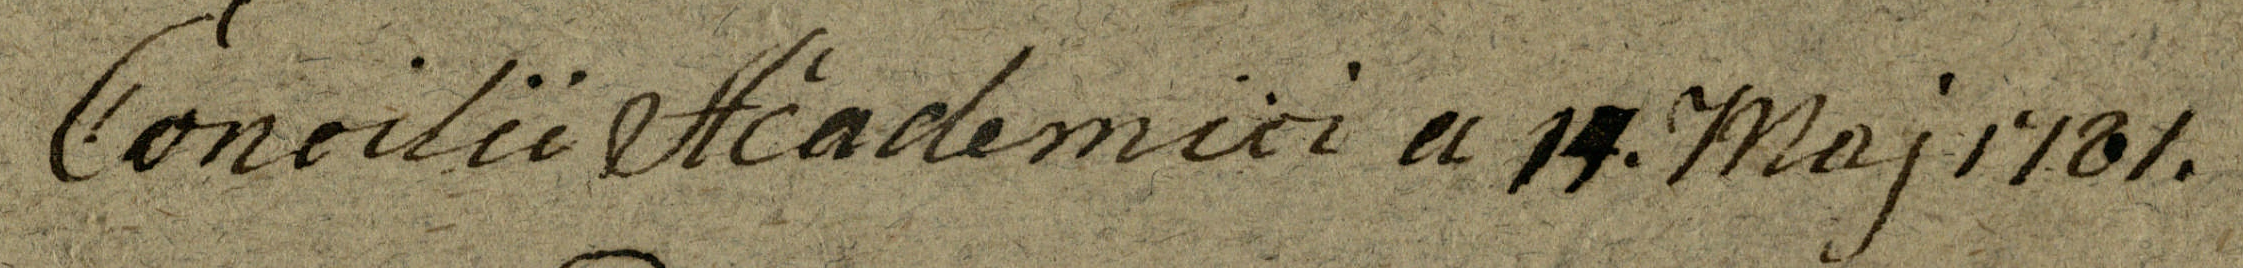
Concilii Academici a 14. Maj 1781.
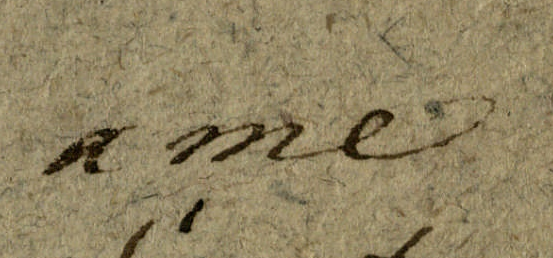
a me
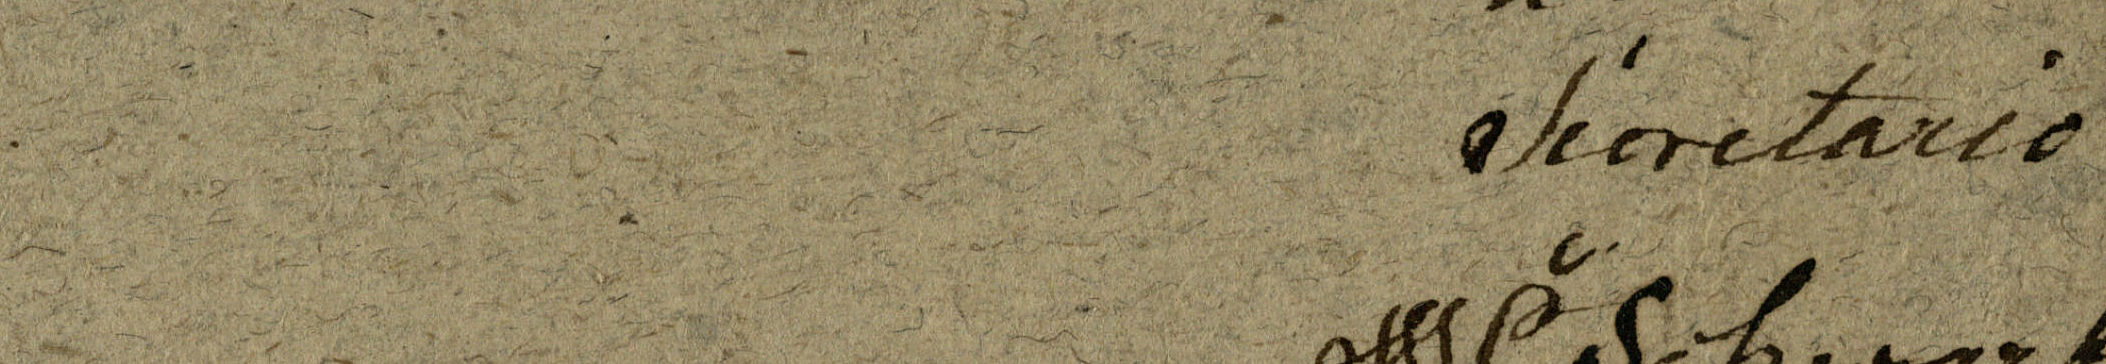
Secretario
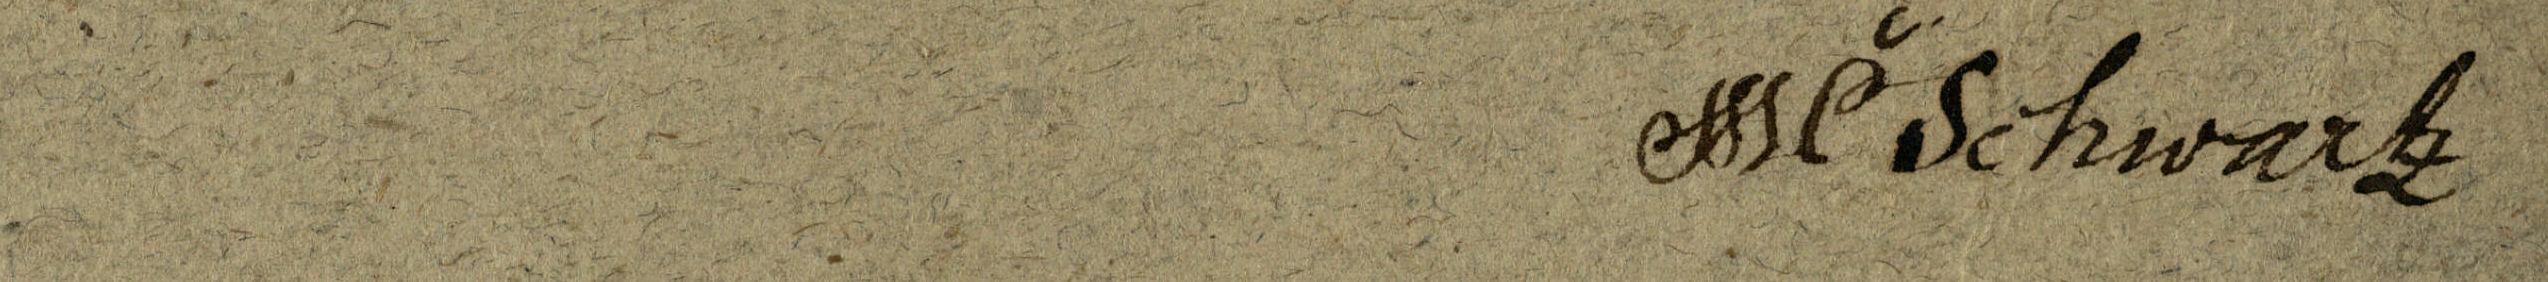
M. C. Schwartz
